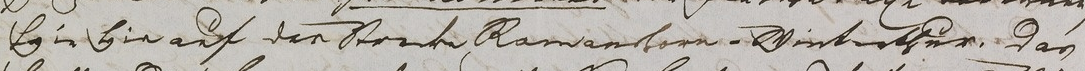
wie wir auf der Strecke Romanshorn–Winterthur. Das
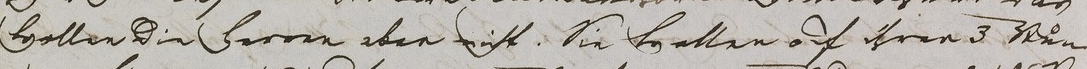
wollen die Herren aber nicht. Sie wollen auf ihrer 3 Stun-
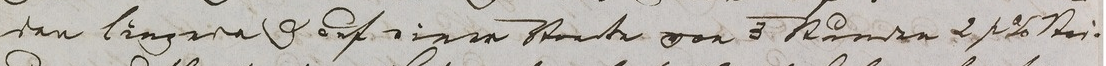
den längern & auf einer Strecke von 3 Stunden 2 p% Stei-
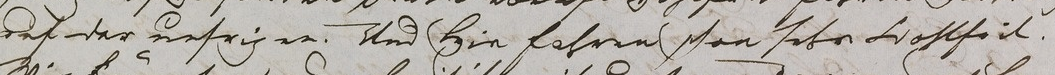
auf der unsrigen. Und wir fahren schon sehr wohlfeil.
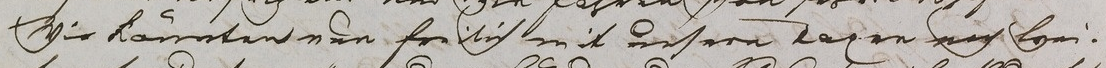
Wir könnten nun freilich mit unsern Taxen noch wei-
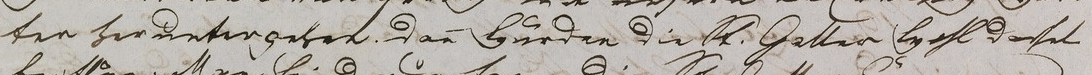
ter heruntergehen. Dann würden die St. Galler wohl dassel-
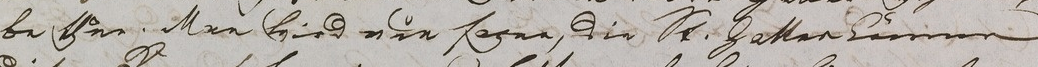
be thun. Man wird nun sagen, die St. Galler können
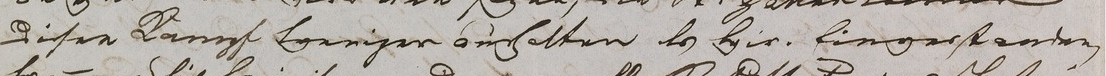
diesen Kampf weniger aushalten als wir. Einverstanden,
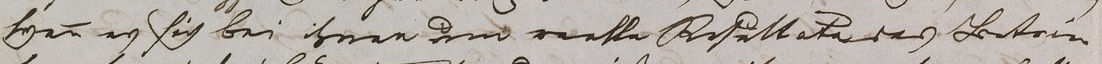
wenn es sich bei ihnen um reelle Resultate des Betrie-
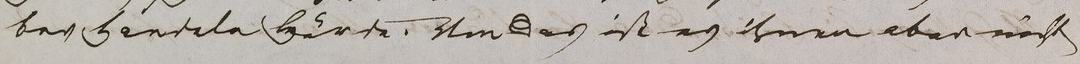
bes handeln würde. Um das ist es ihnen aber nicht
